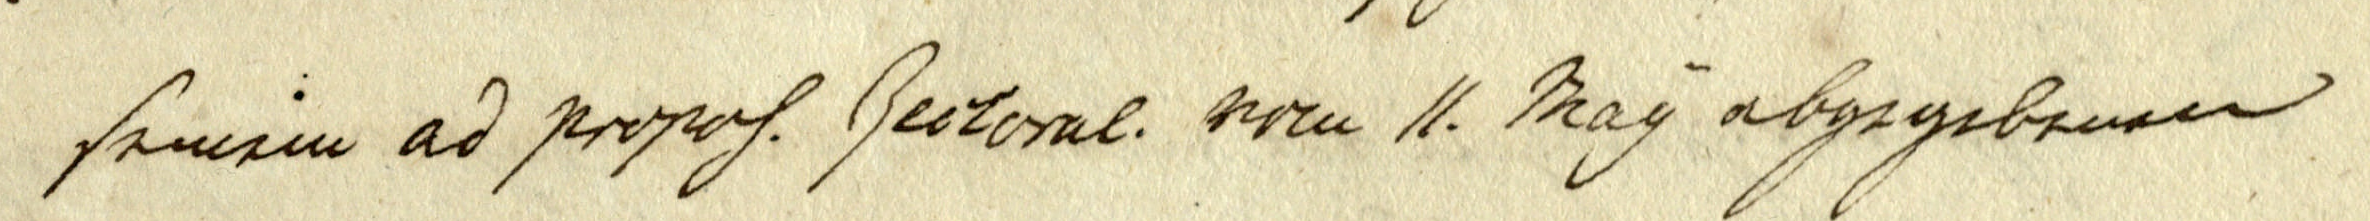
seinem ad propos. Rectoral. vom 11. Maÿ abgegebenen
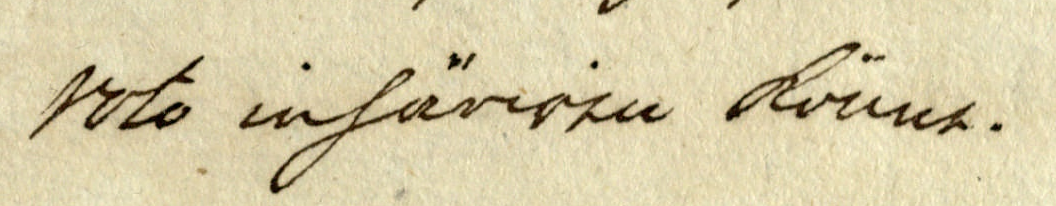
voto inhäriren könne.
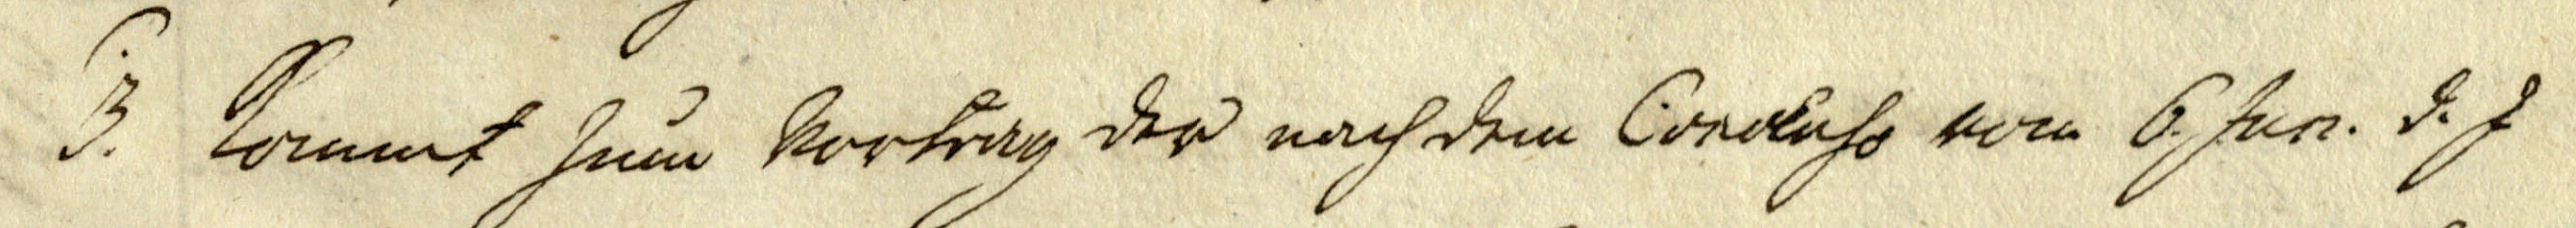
3. Kommt zum Vortrag der nach dem Concluso vom 6. Jun. d. J.
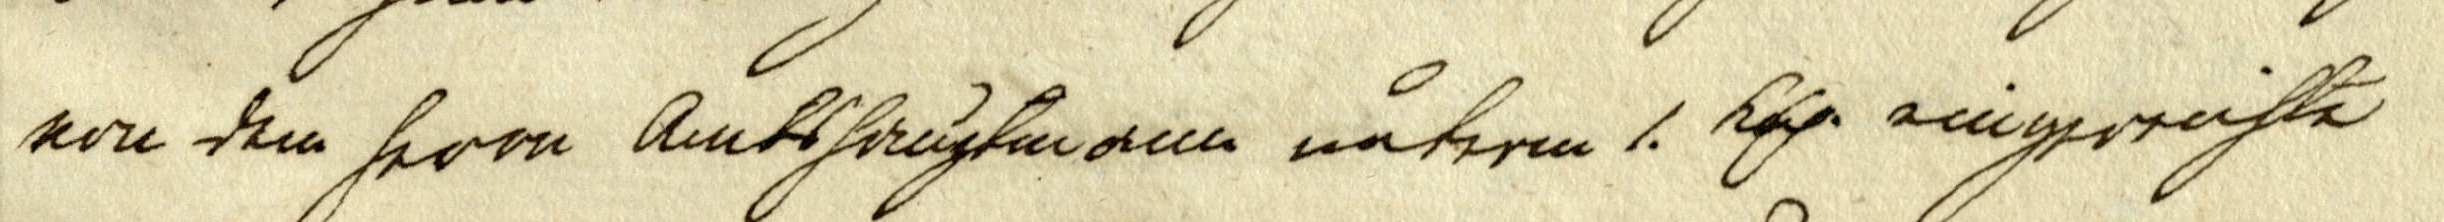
von dem herrn Amtshauptmann unterm 1. huj. eingereichte
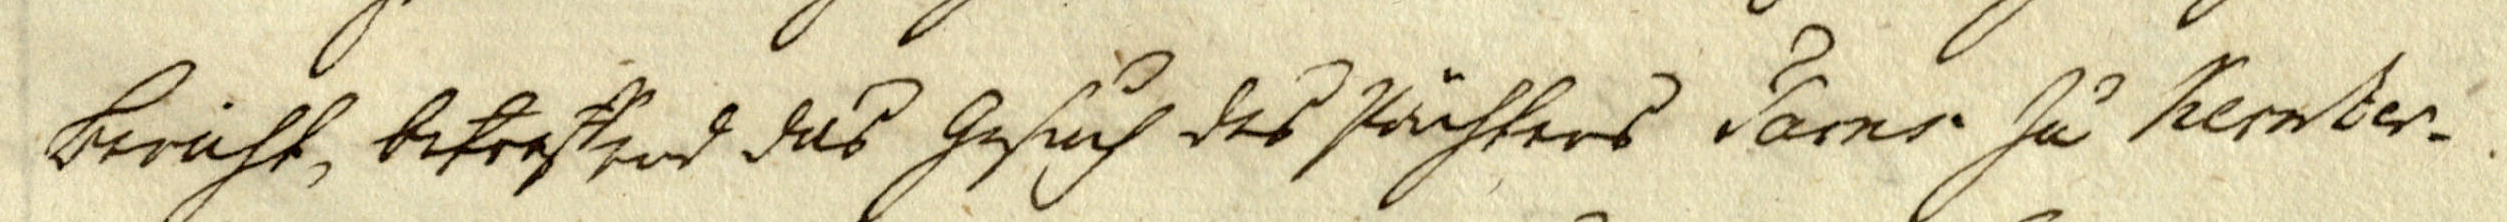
Bericht, betreffend das Gesuch des Pächters Tams zu Kemzer¬
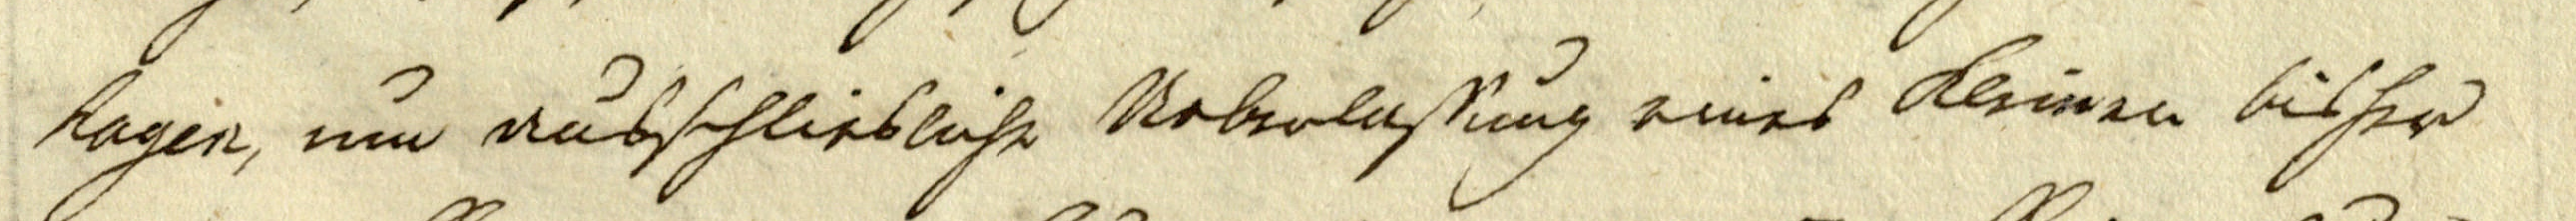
hagen, um ausschliesliche Ueberlassung eines kleinen bisher
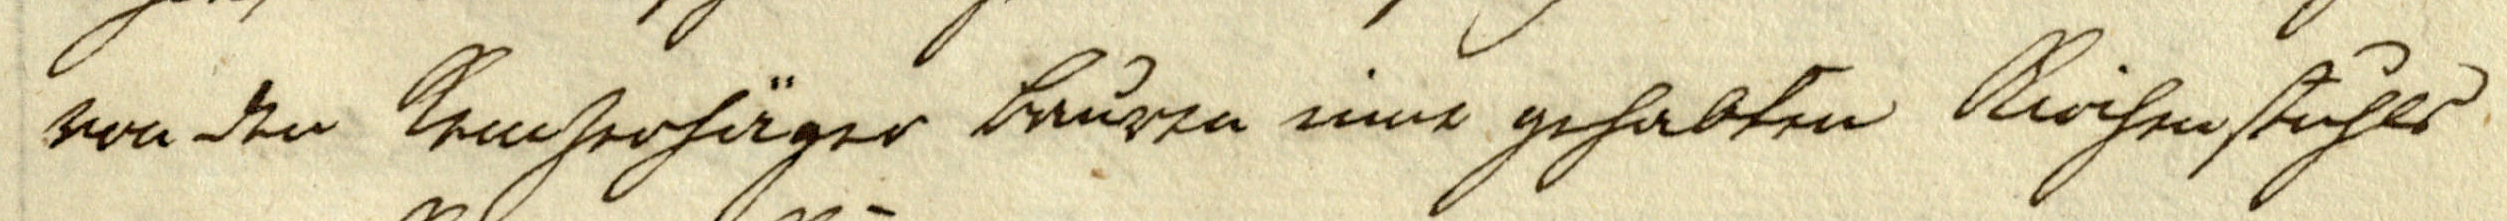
von den Kemzerhäger Bauren inne gehabten Kirchenstuhls
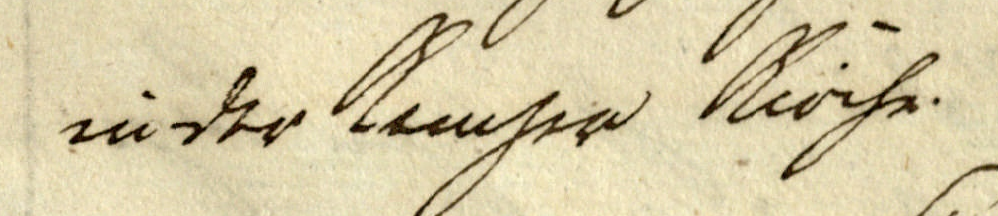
in der Kemzer Kirche.
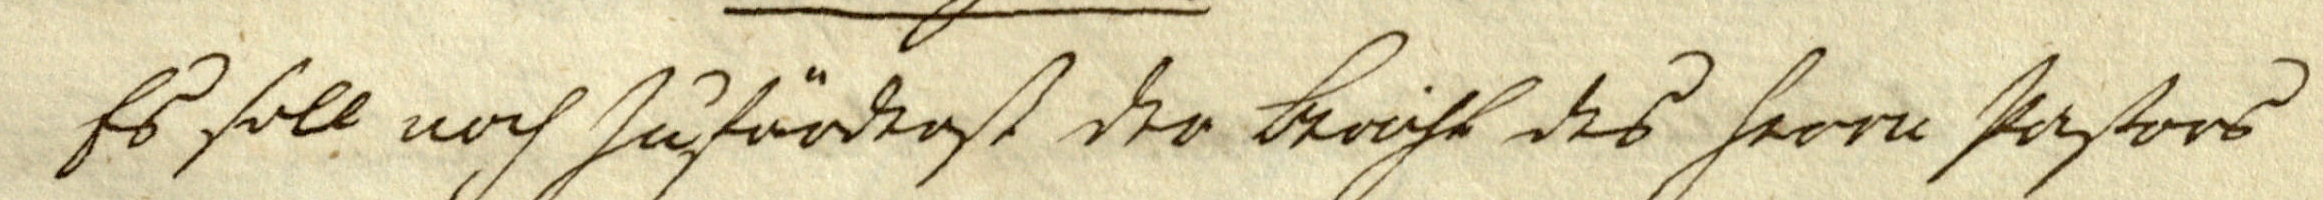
Es soll noch zuförderst der Bericht des herrn Pastors
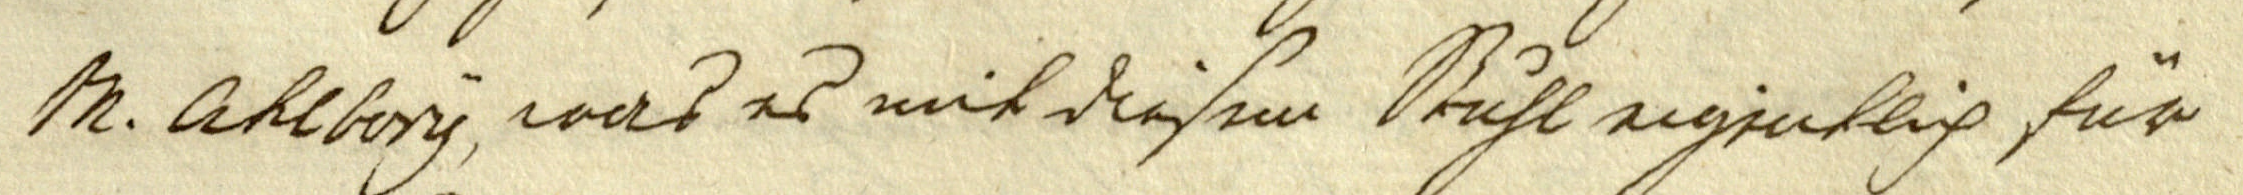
M. Ahlbory, was es mit diesem Stuhl eigentlich für
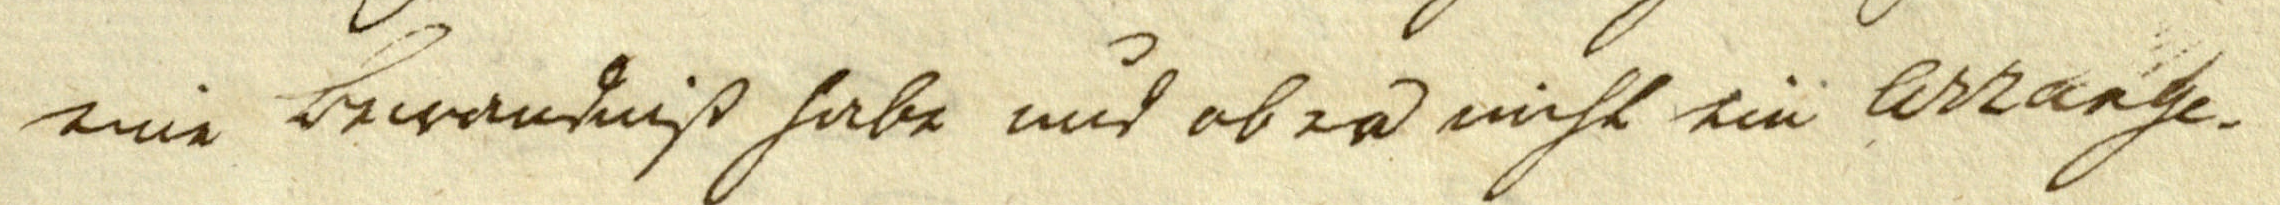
eine Bewandnis habe und ob er nicht ein Arrange¬
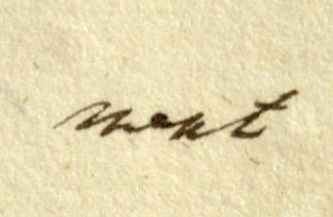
ment
